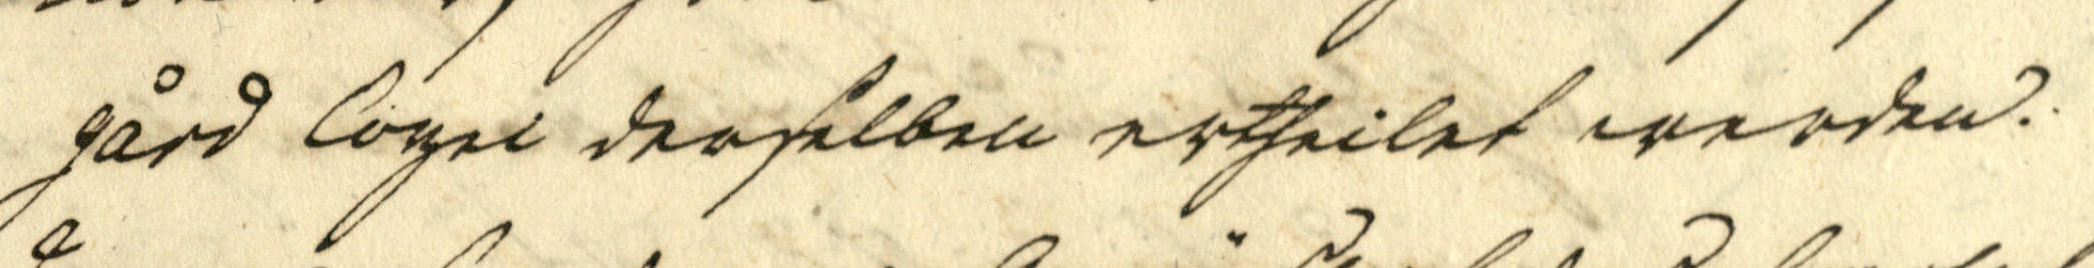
gård Copei derselben ertheilet werden.
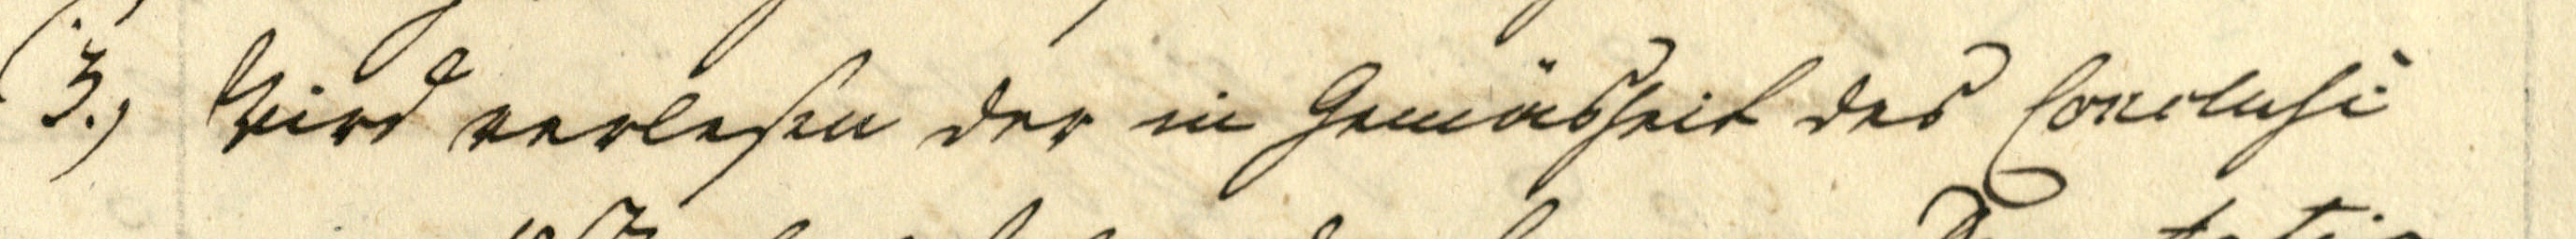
3., Wird verlesen der in Gemäsheit des Conclusi
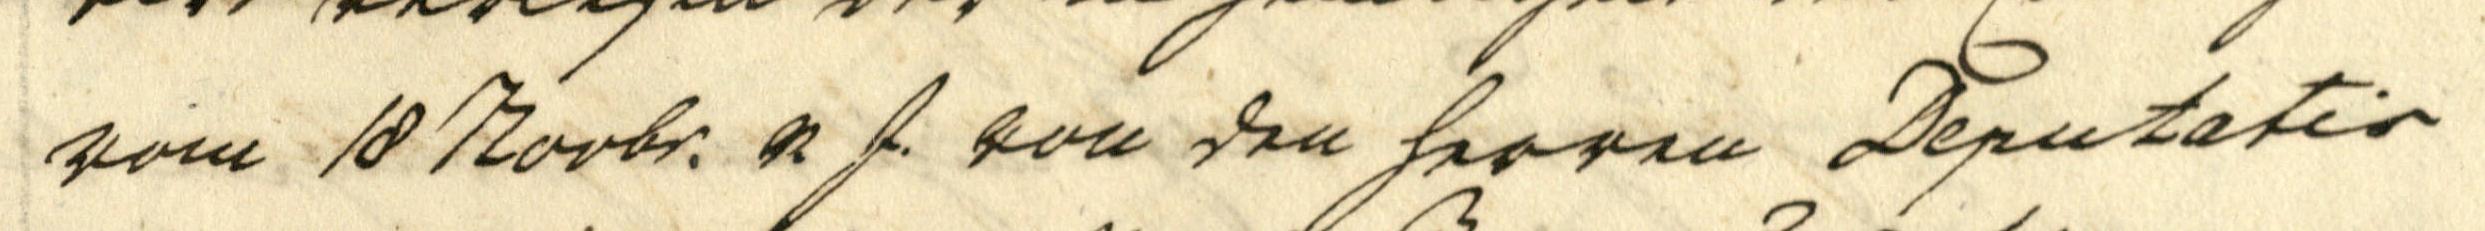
vom 18 Novbr. v. J. von den Herren Deputatis
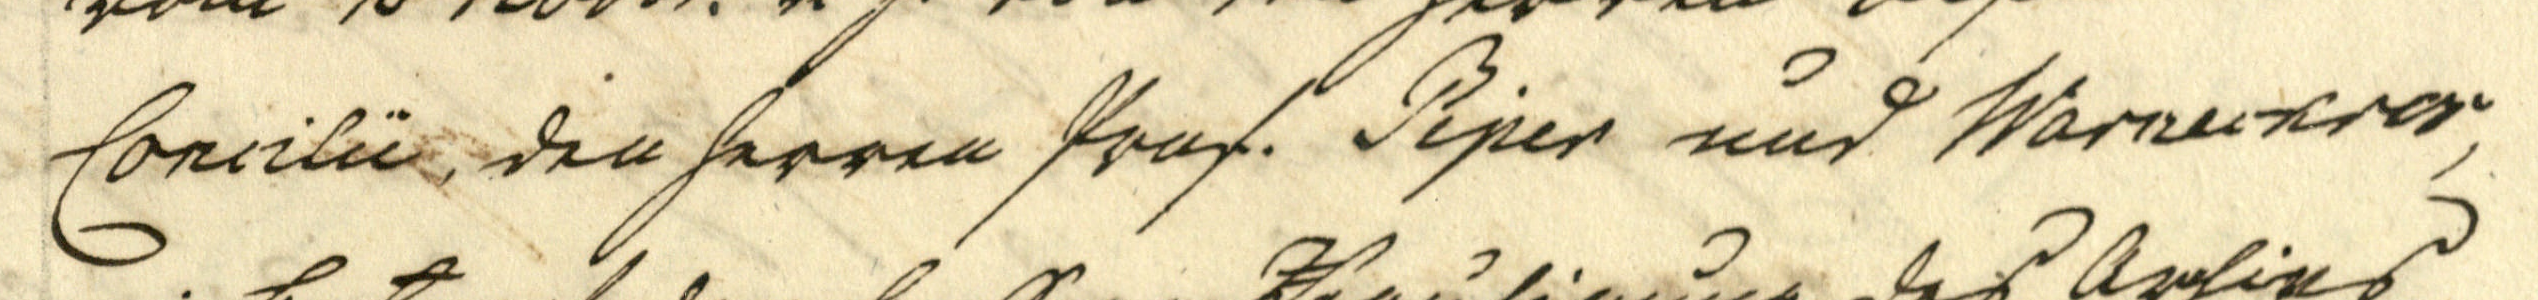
Concilii, den Herren Prof. Piper und Warneckros,
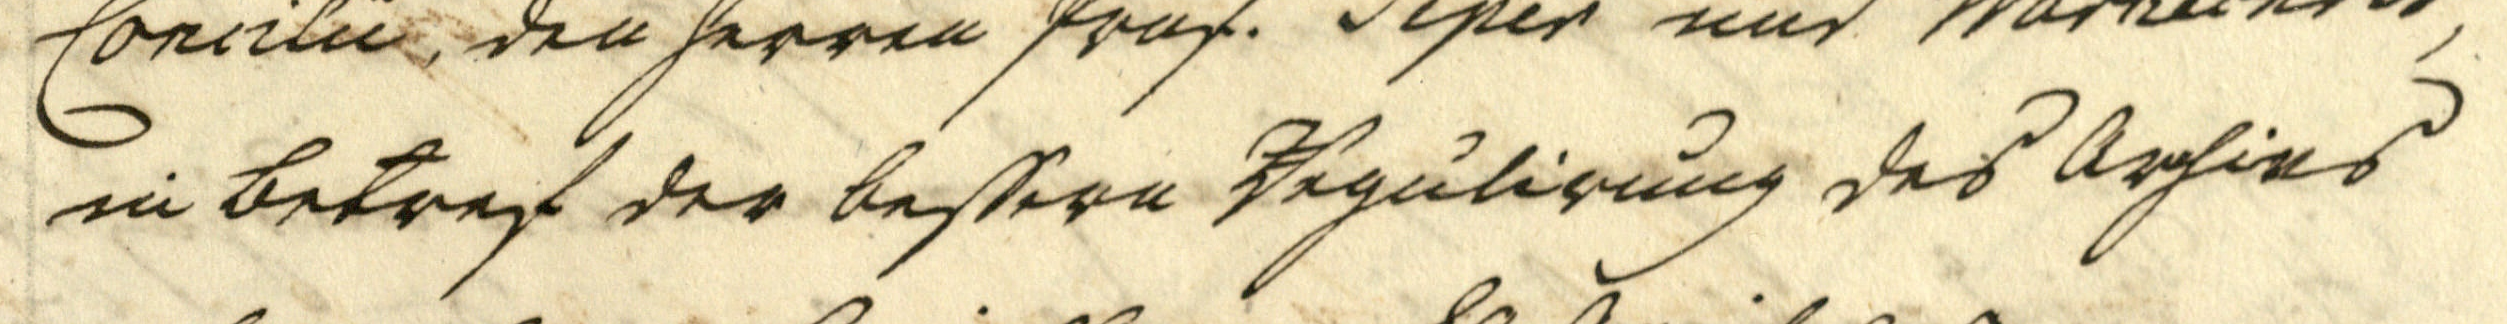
in Betref der bessern Regulirung des Archivs
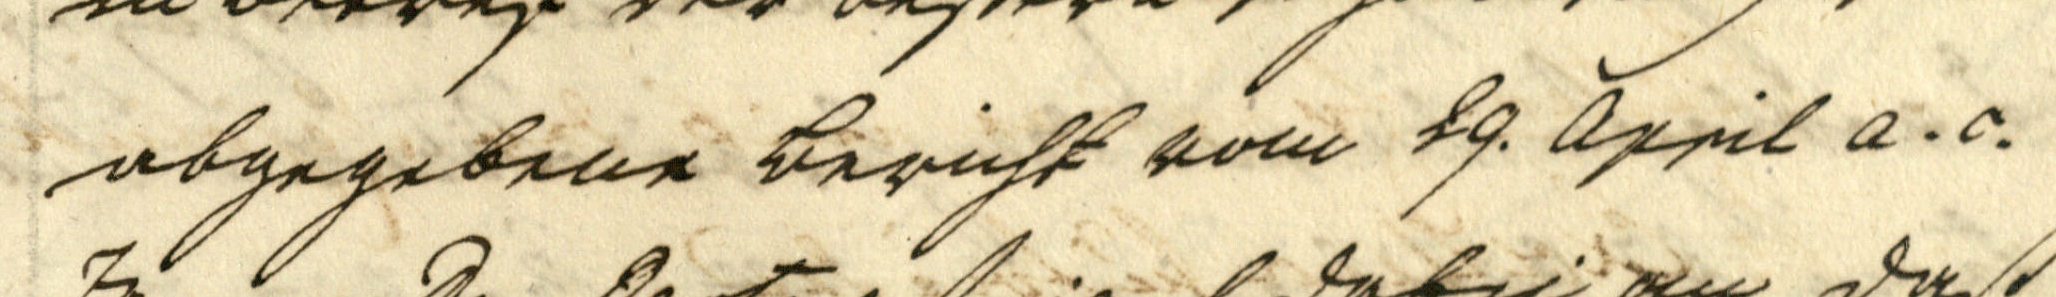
abgegebene Bericht vom 29. April a. c.
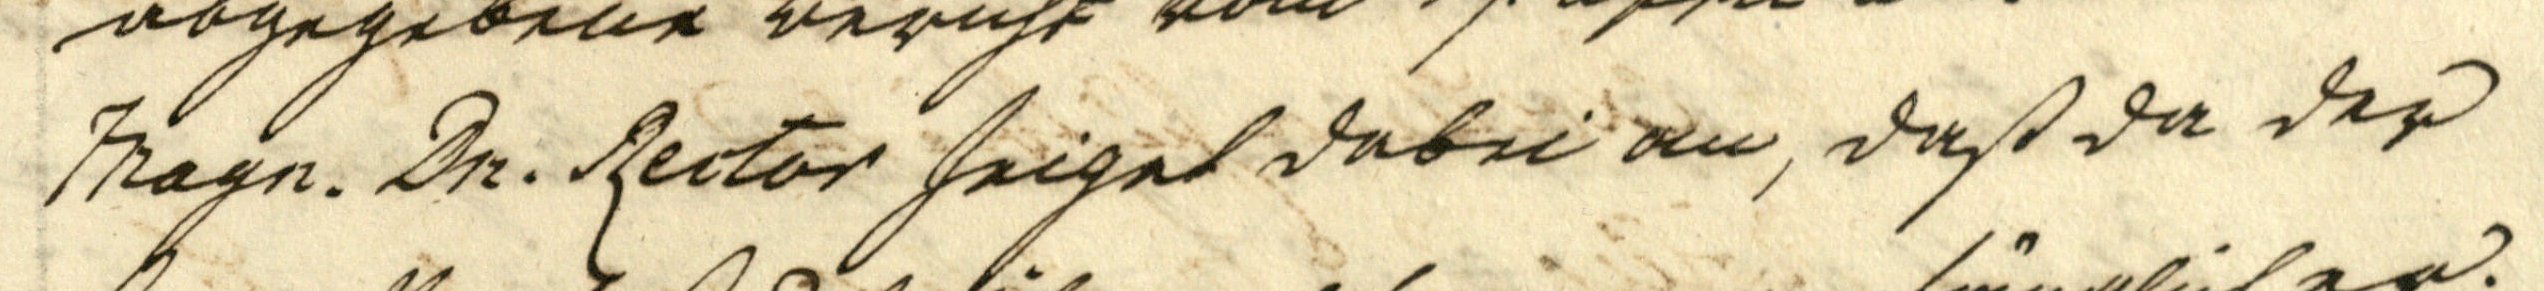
Magn. Dn. Rector zeiget dabei an, daß da der
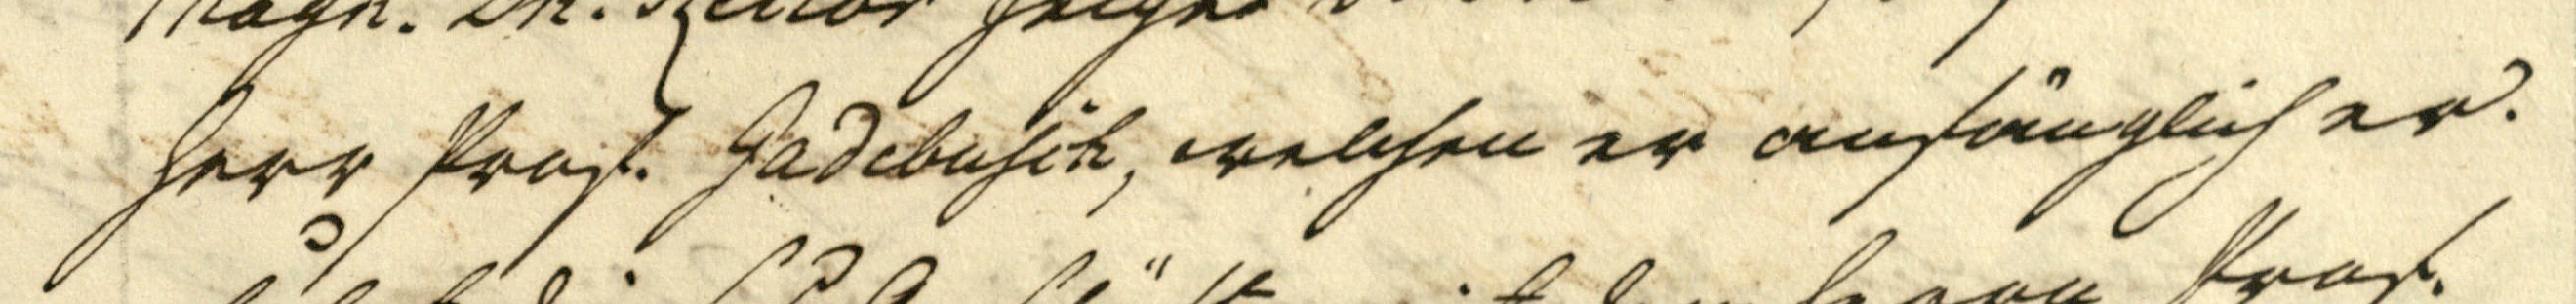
Herr Prof. Gadebusch, welchen er anfänglich er¬
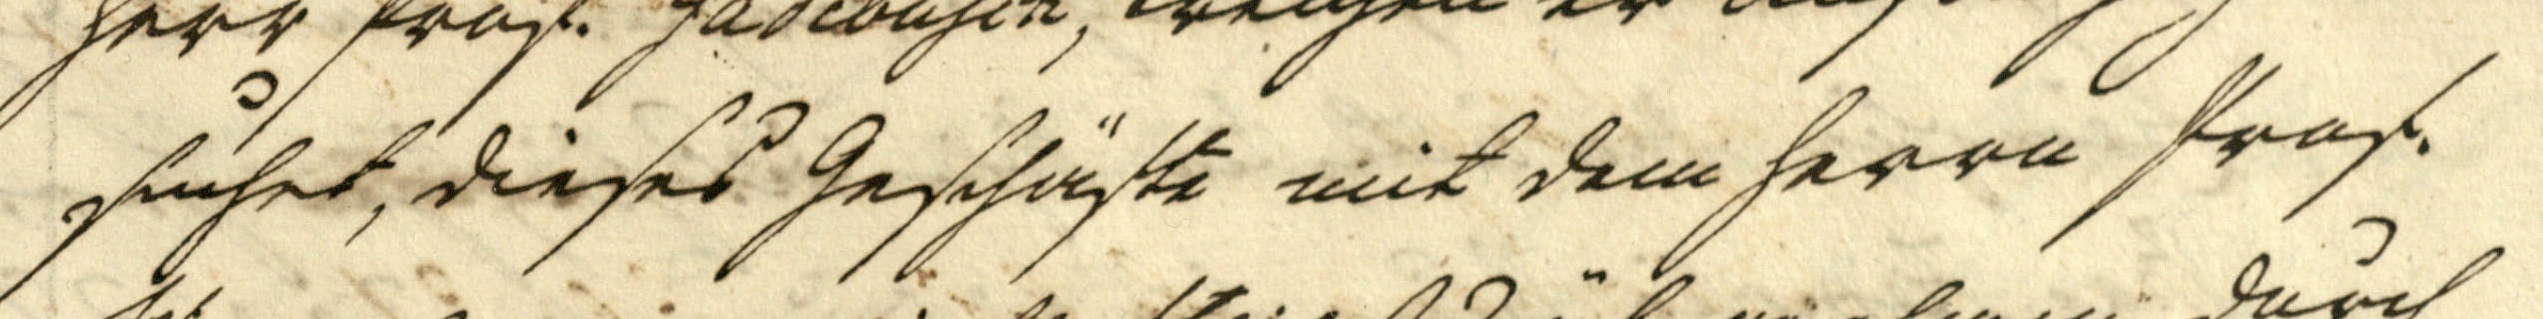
suchet, dieses Geschäfte mit dem Herrn Prof.
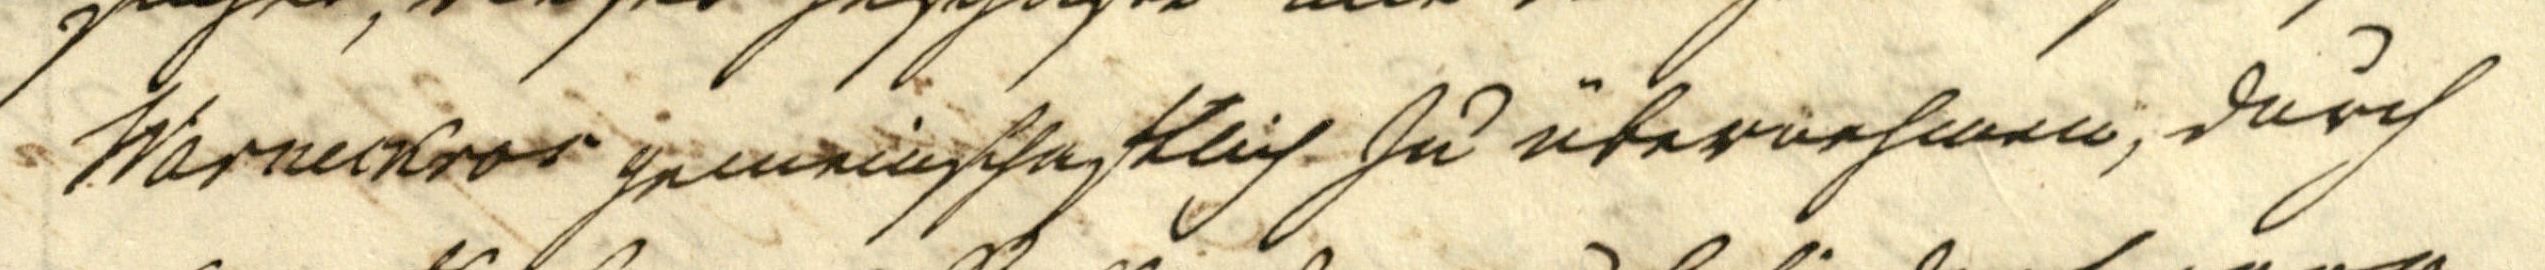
Warneckros gemeinschaftich zu übernehmen, durch
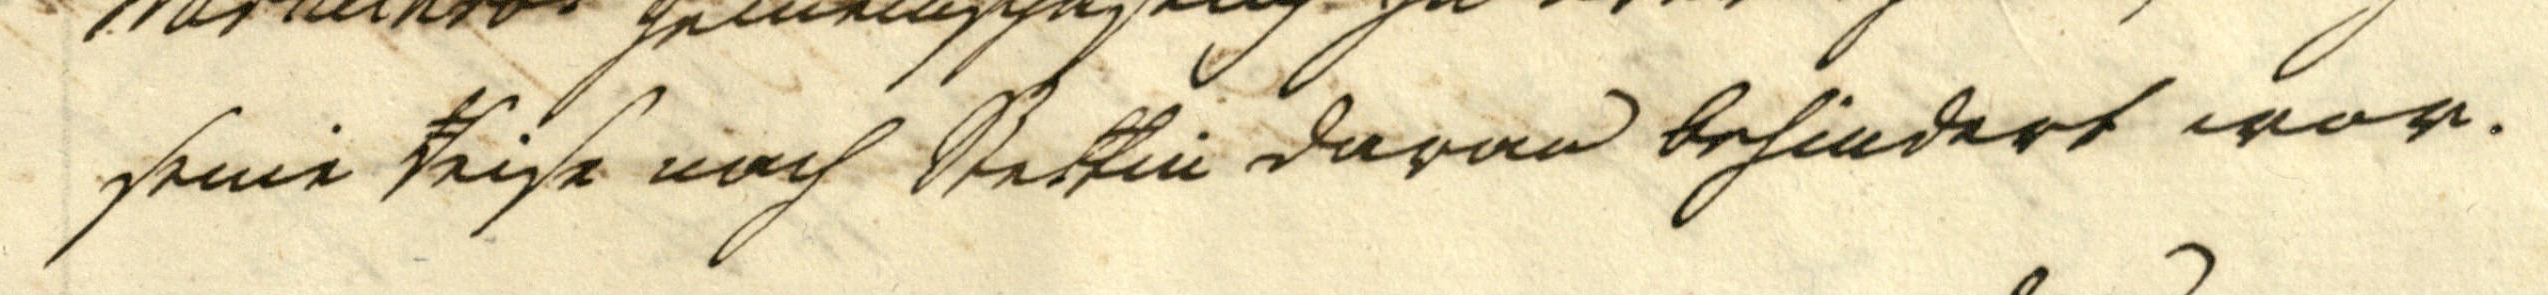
seine Reise nach Stettin daran behindert wor¬
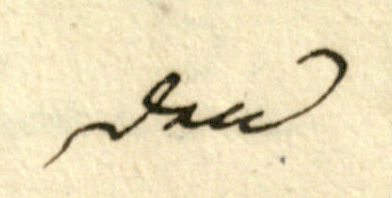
den
